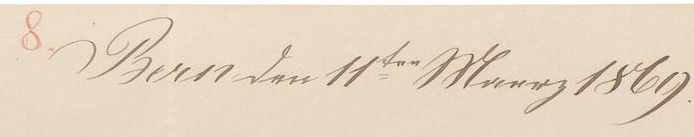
Bern den 11ten Maerz 1869.
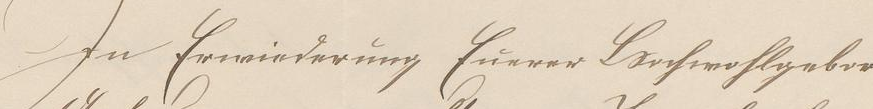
In Erwiederung Euerer Hochwohlgeborn
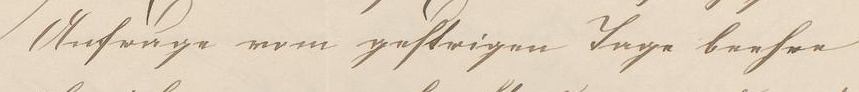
Anfrage vom gestrigen Tage beehre
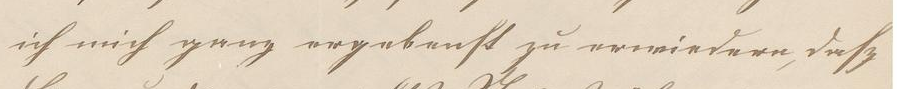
ich mich ganz ergebenst zu erwiedern, dasz
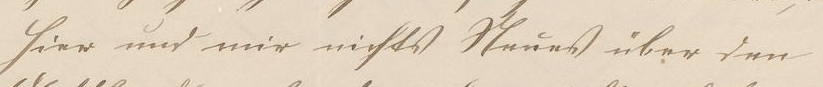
hier und mir nichts Neues über den
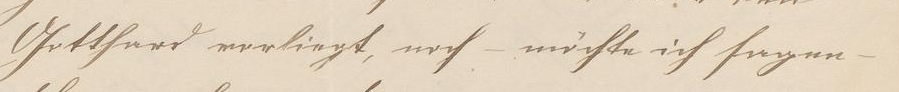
Gotthard vorliegt, noch – möchte ich sagen –
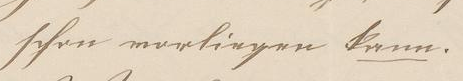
schon vorliegen kann.
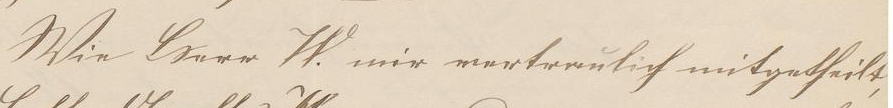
Wie Herr W. mir vertraulich mitgetheilt,
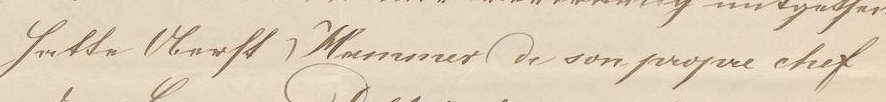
hatte Oberst Hammer de son propre chef
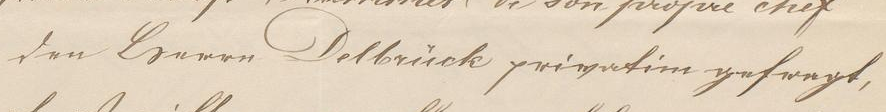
den Herrn Delbrück privatim gefragt,
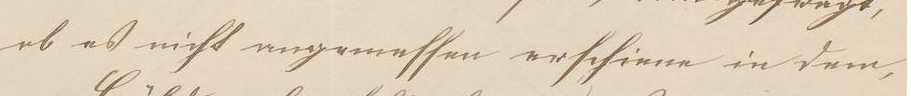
ob es nicht angemessen erschiene in dem,
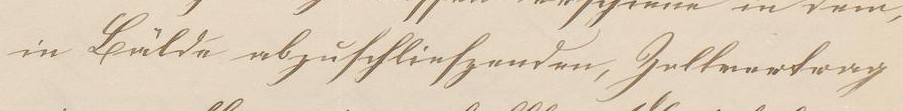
in Bälde abzuschlieszenden, Zollvertrag
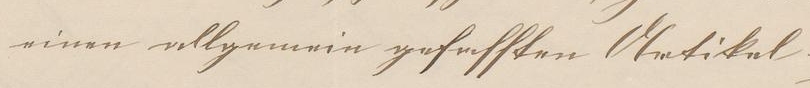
einen allgemein gefassten Artikel
